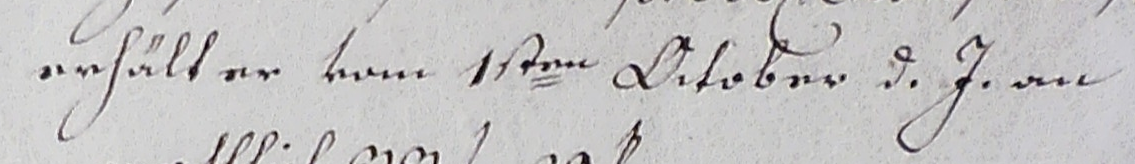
erhält er vom 1ste͇n October d. J. an
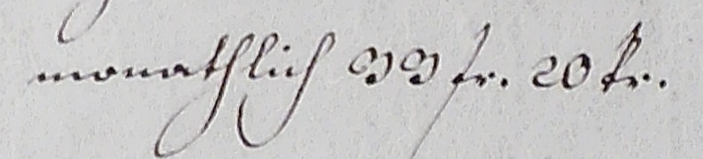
monathlich 33 fr. 20 kr.
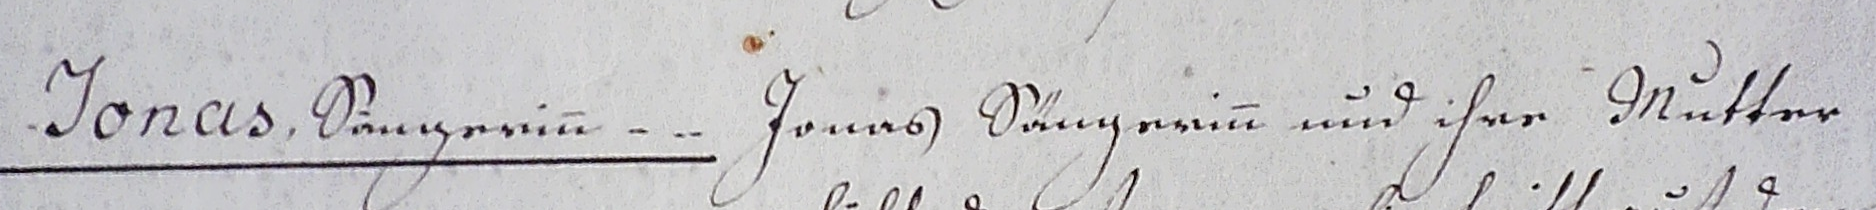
Jonas, Sängerin̅ .. .. Jonas Sängerin̅ und ihre Mutter
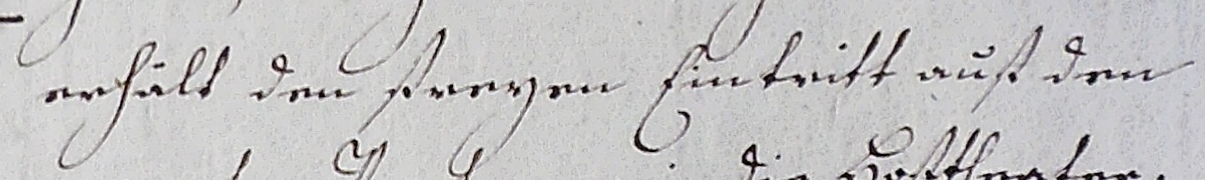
erhält den freyen Eintritt auf den
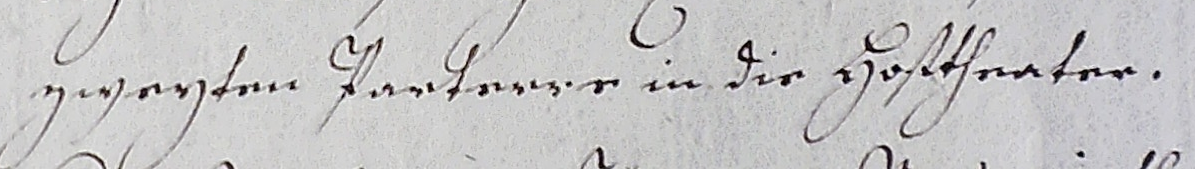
zweyten Parterre in die Hoftheater.
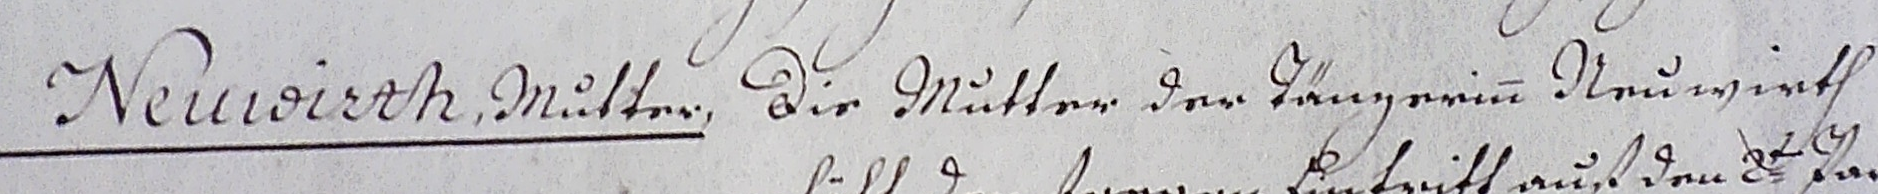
Neuwirth, Mutter, Die Mutter der Tänzerin̅ Neuwirth
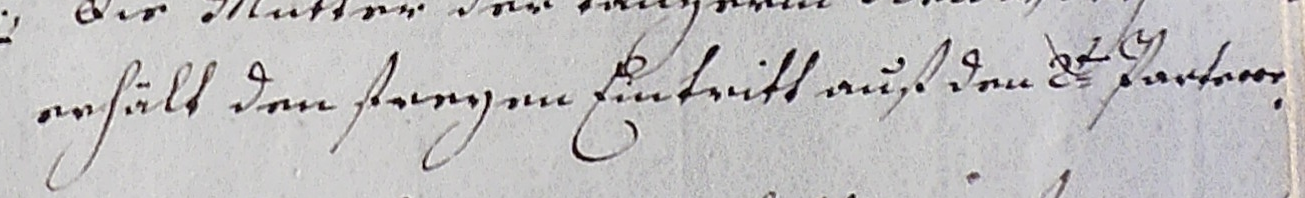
erhält den freyen Entritt auf den 2t͇e Parterre.
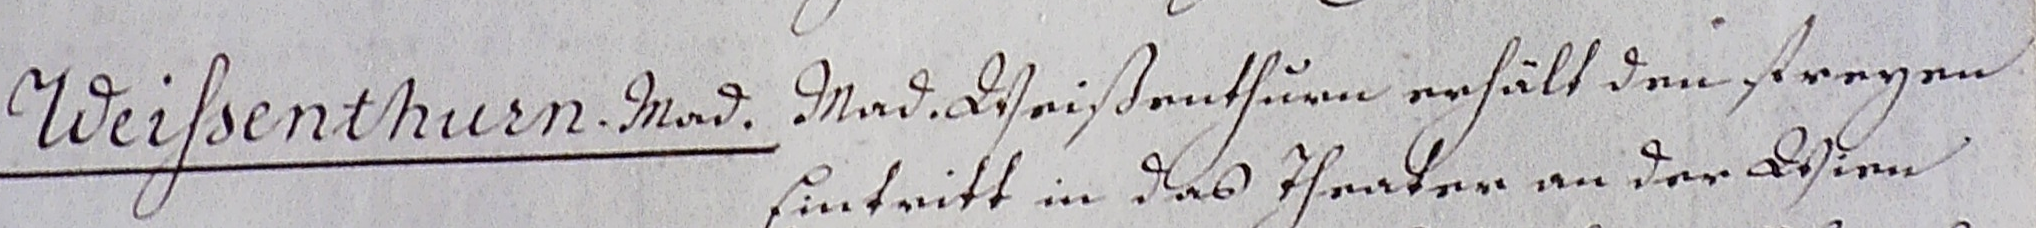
Weissenthurn. Mad. Mad.Weißenthurn erhält den freyen
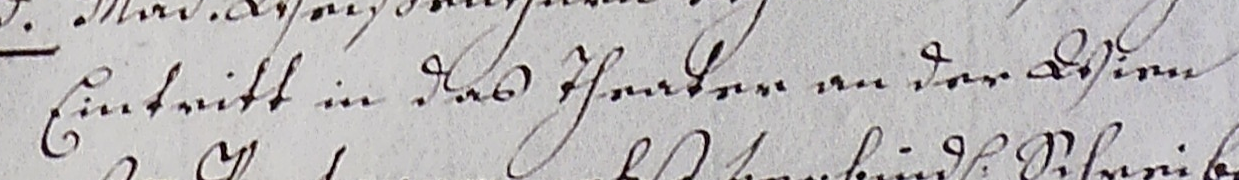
Eintritt in das Theater an der Wien
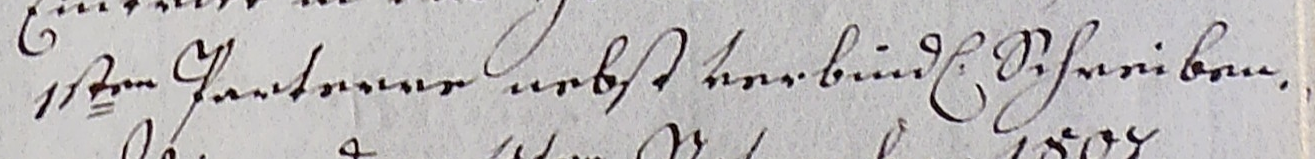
1ste͇n Parterre nebst verbindl: Schreiben.
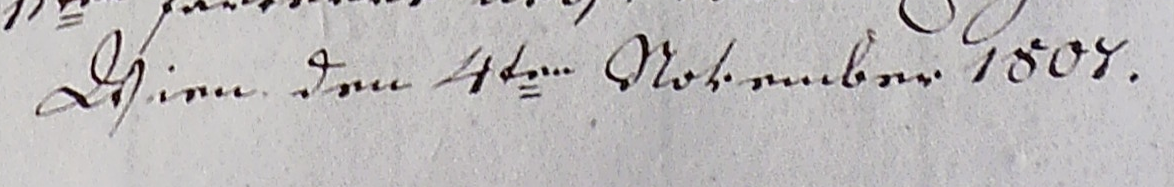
Wien den 4te͇n November 1807.
